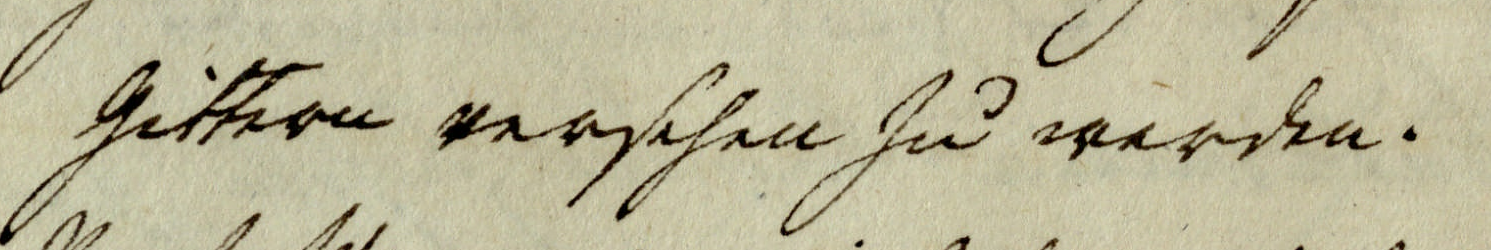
Gittern versehen zu werden.
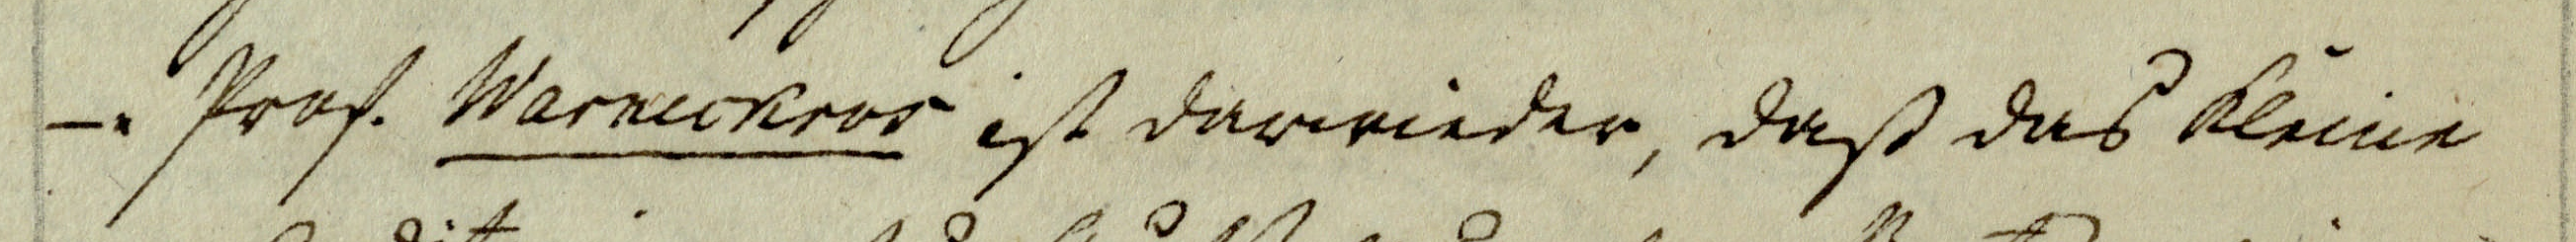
Prof. Warneckros ist darwieder, daß das kleine
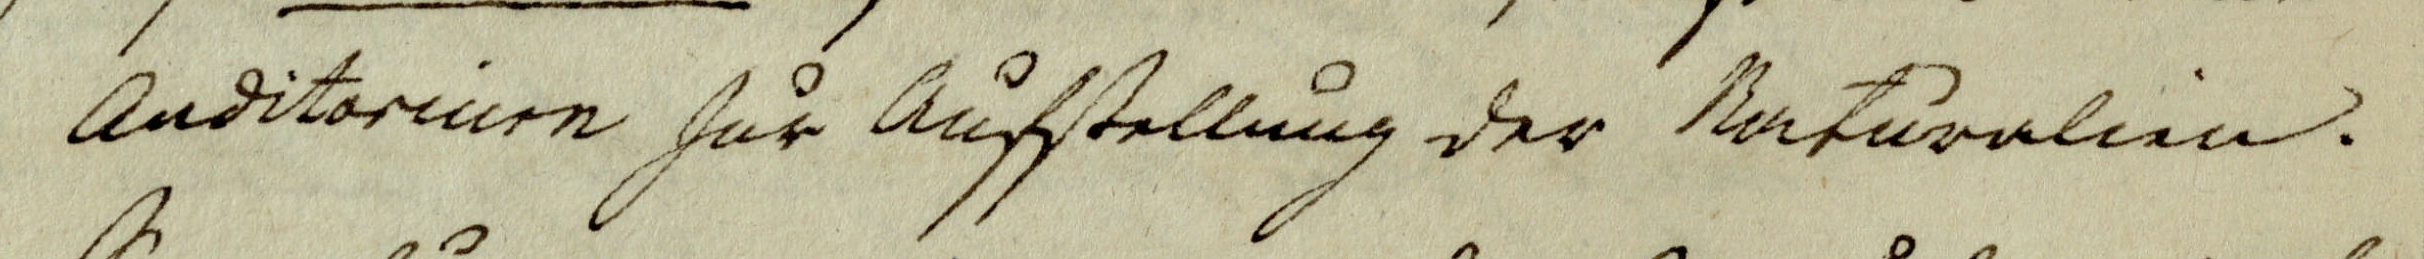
Auditorium zur Aufstellung der Naturalien¬
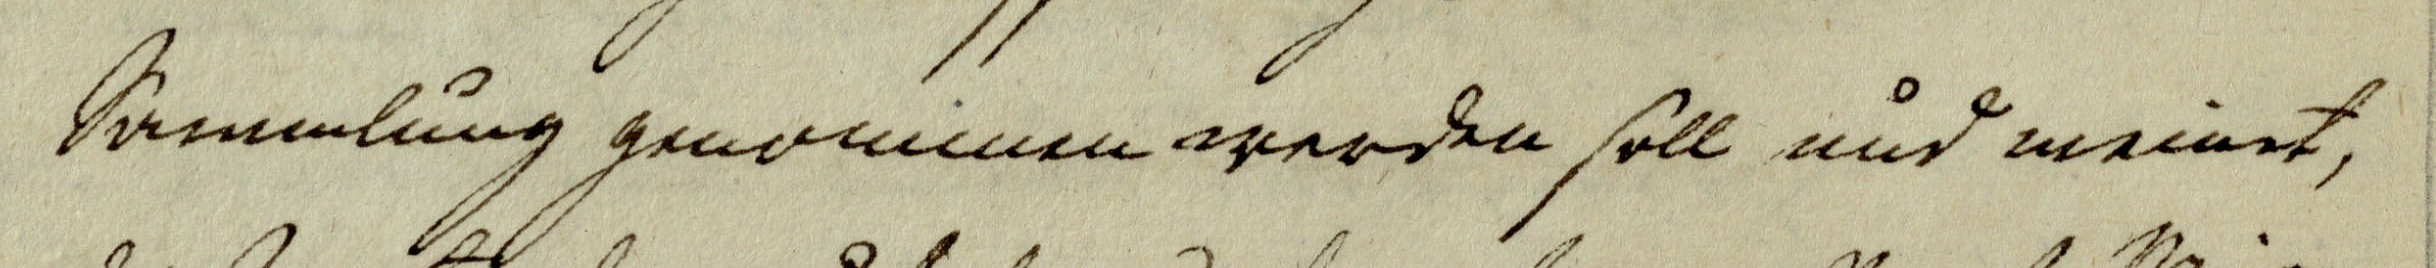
Sammlung genommen werden soll und meinet,
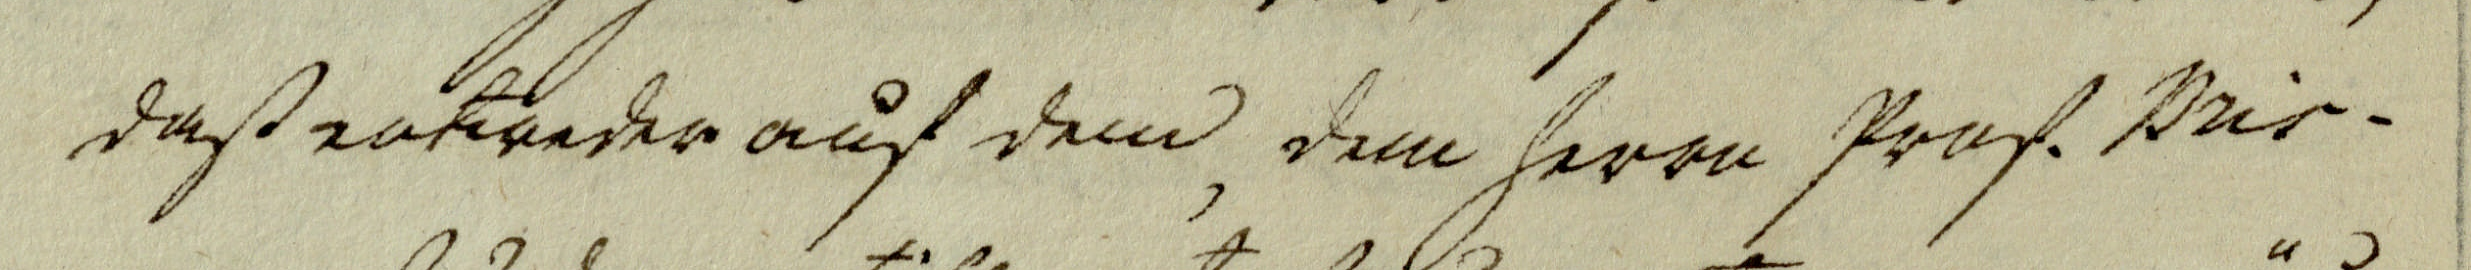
daß entweder auf dem dem Herrn Prof. Bris¬
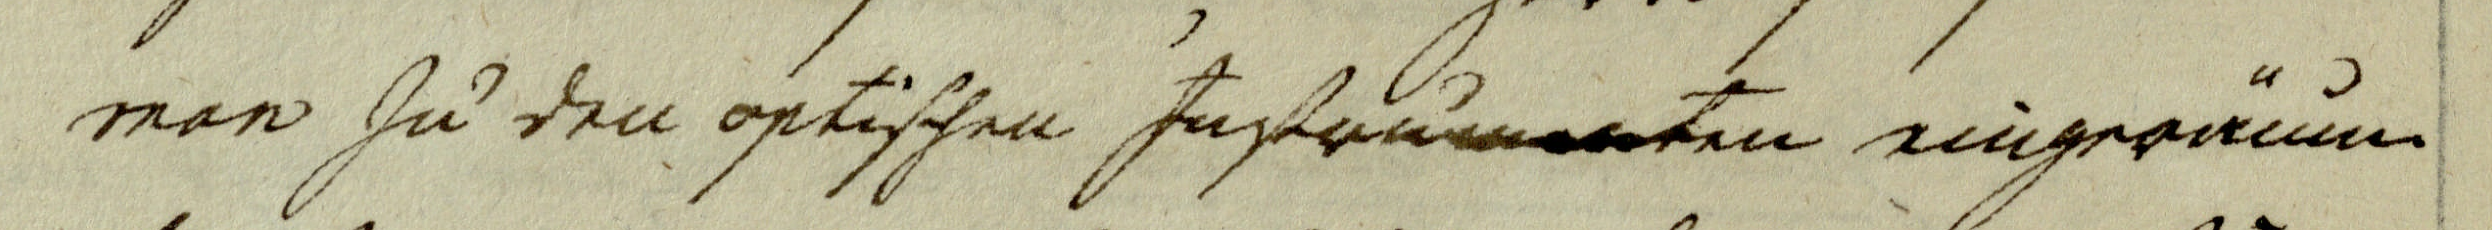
man zu den optischen Instrumenten eingeräum¬
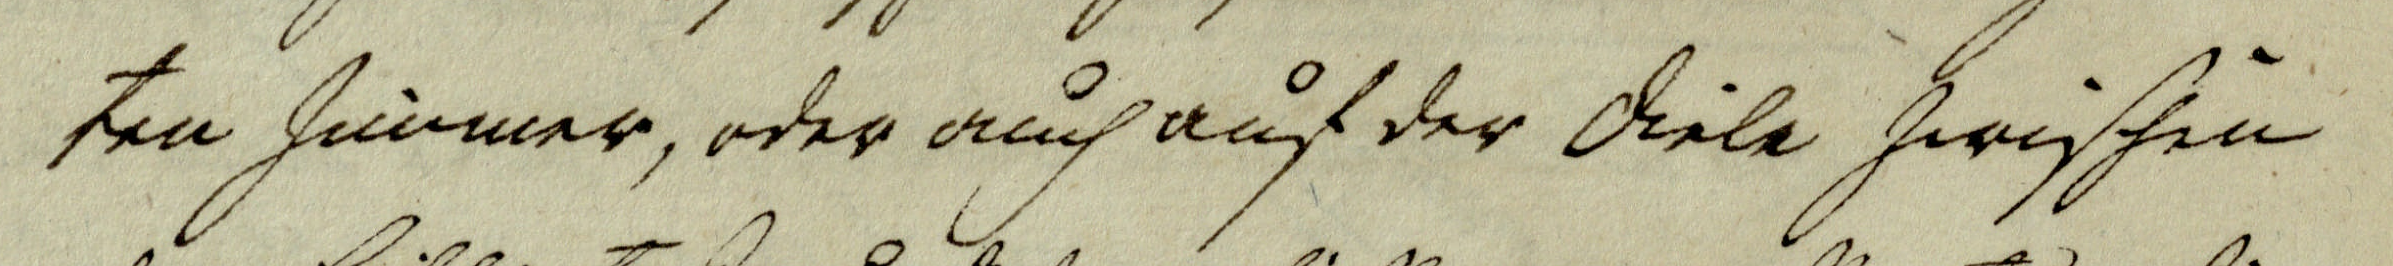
ten Zimmer, oder auch auf der Diele zwischen
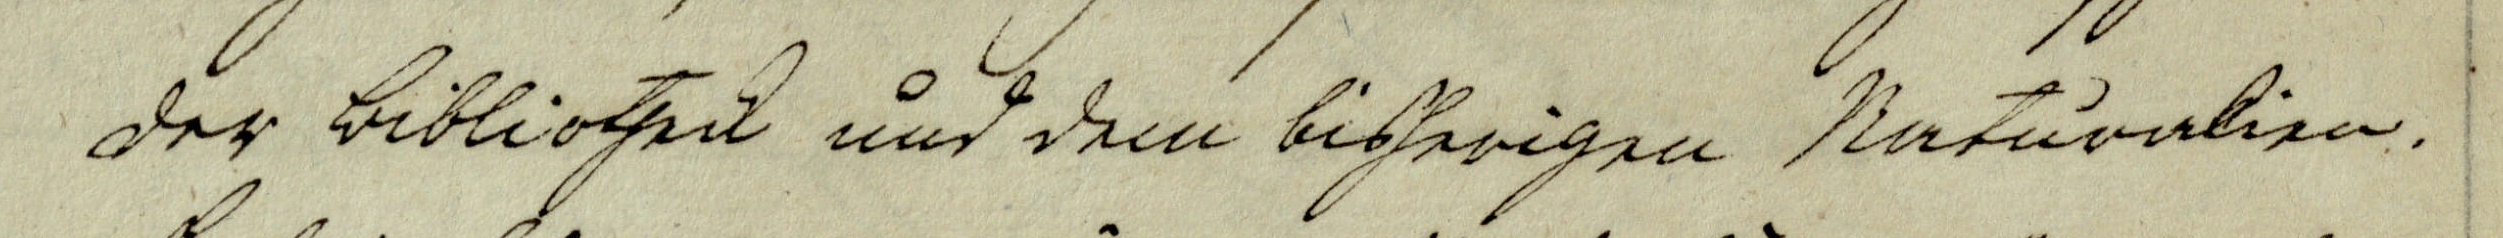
der Bibliotheck und dem bisherigen Naturalien¬
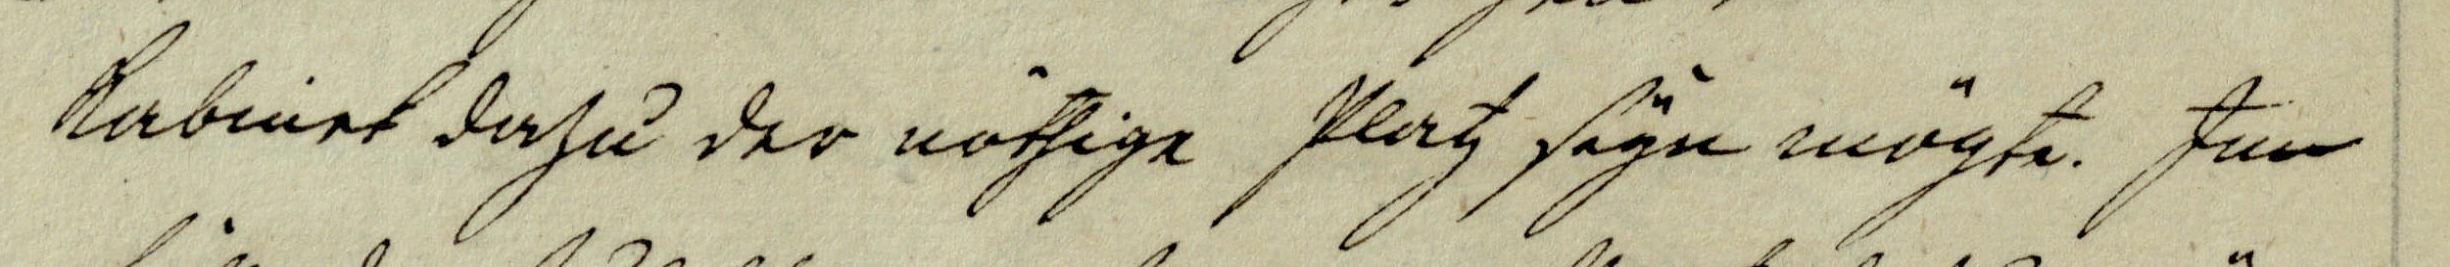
Kabinet dazu der nöthige Platz seÿn mögte. Im
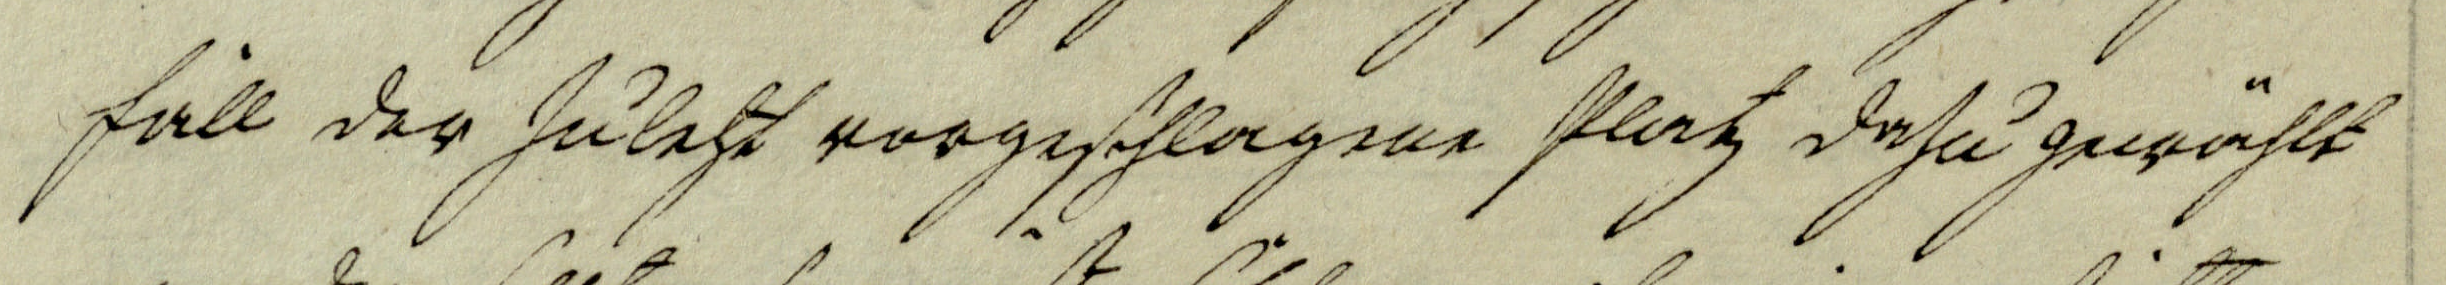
Fall der zuletzt vorgeschlagene Platz dazu gewählt
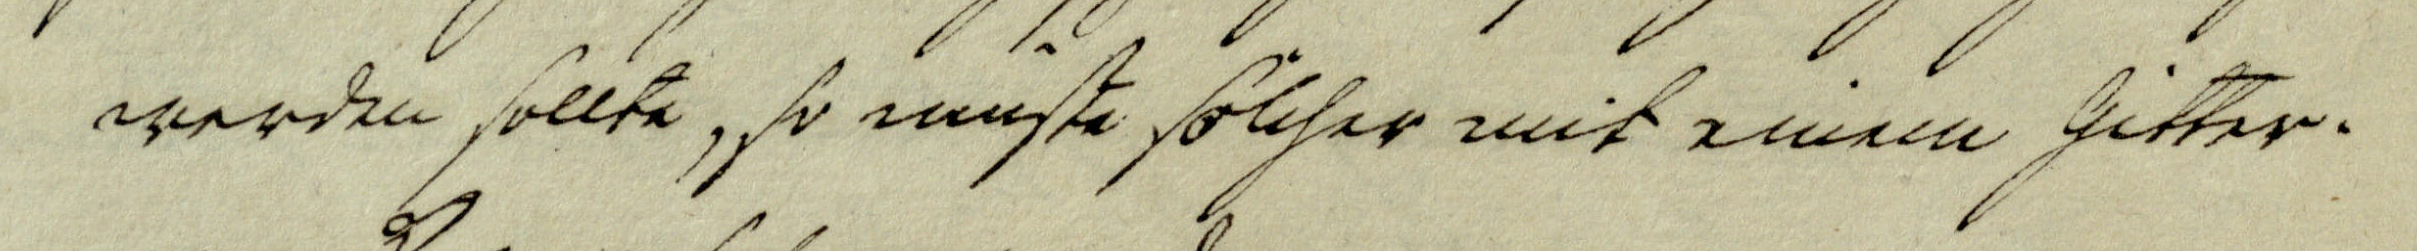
werden sollte, so müßte solcher mit einem Gitter¬
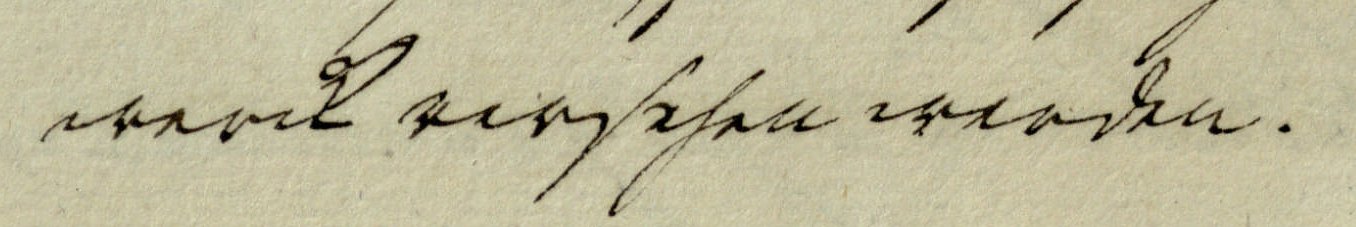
werck versehen werden.
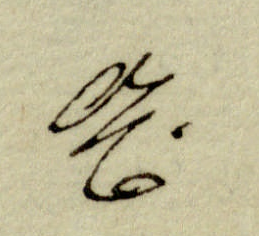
dh.
